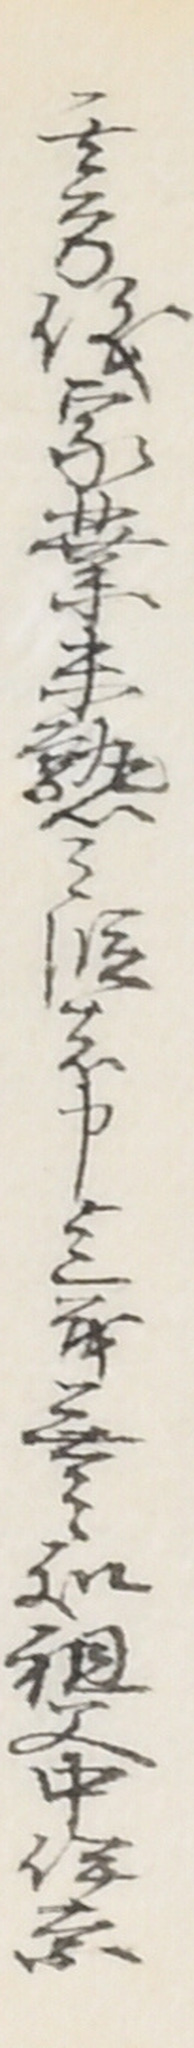其方儀家業未熟之段者申迄茂無之処祖父中伊奈
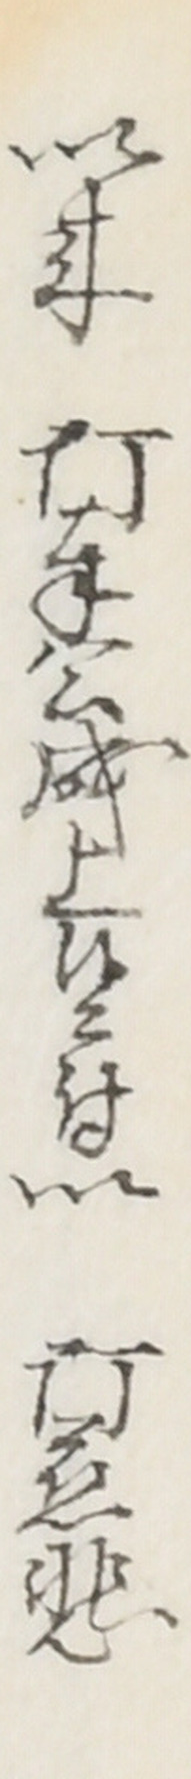以来御方向成上候ニ付以御慈悲
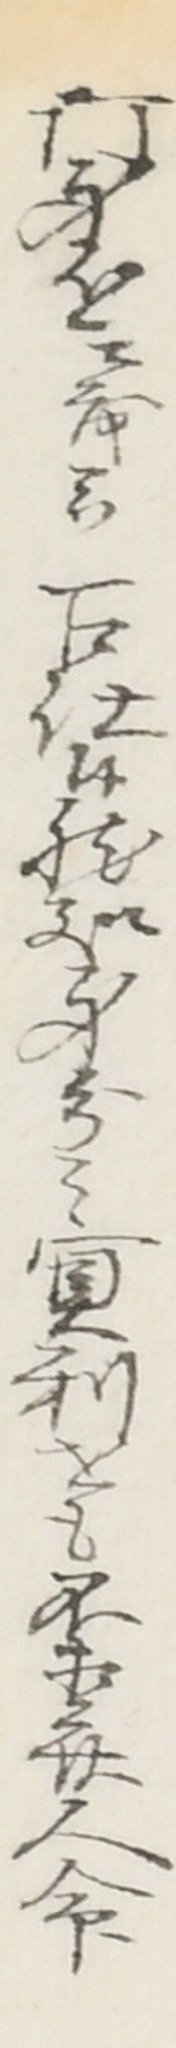御身近ニ茂被召仕候然処身分冥利をも不相弁人命
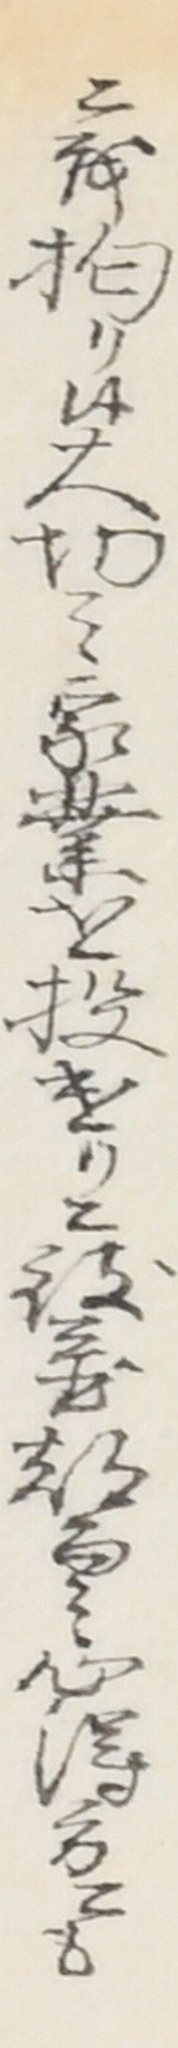ニ茂拘リ候大切之家業を投遣リニ致置都而之心得方ニも
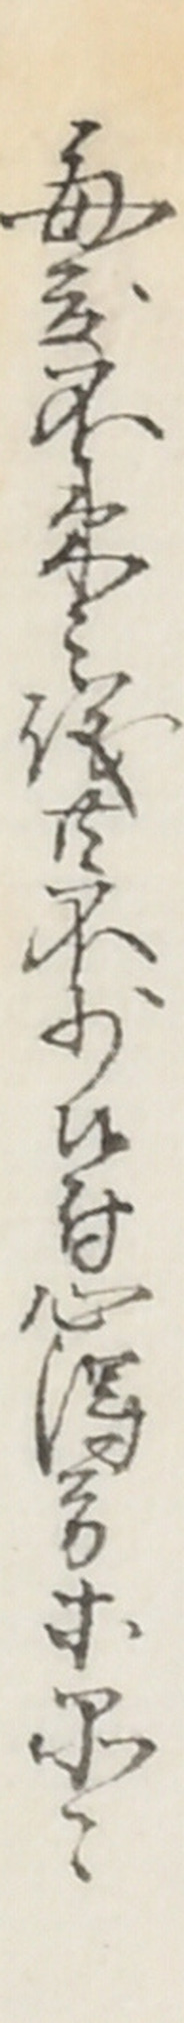毎度不束之儀共不少候付心得方等品々
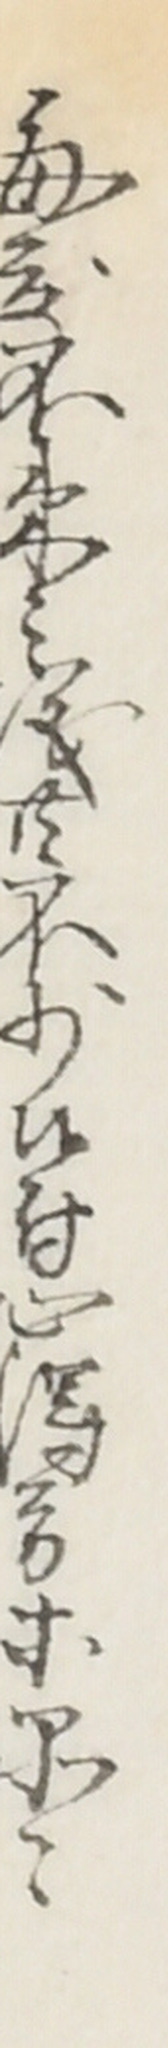毎度不束之儀共不少候付心得方等品々
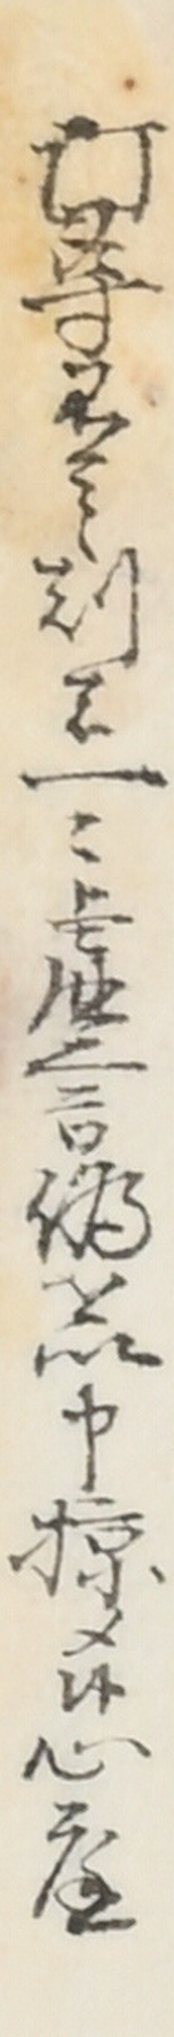御尋有之刻者一々虚言偽を以申掠メ候心底
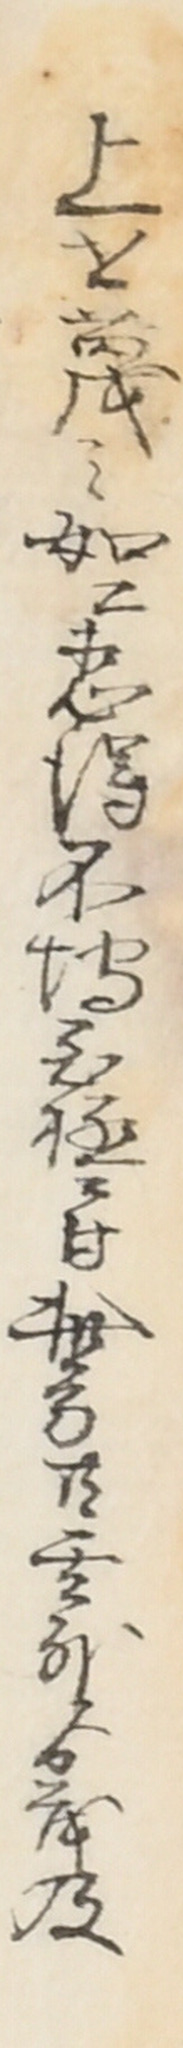上を蔑み如ニ相心得不埒至極ニ付此方共其外ゟ茂及
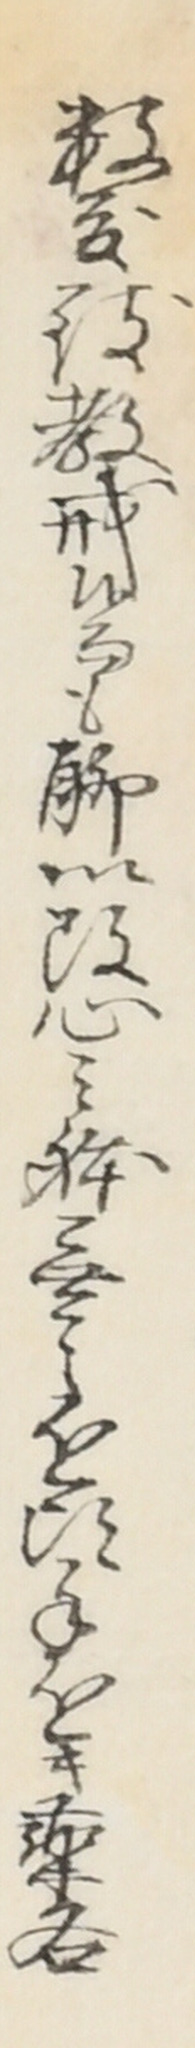数度致教戒候而も聊以改心之躰無之近頃手近キ薬名
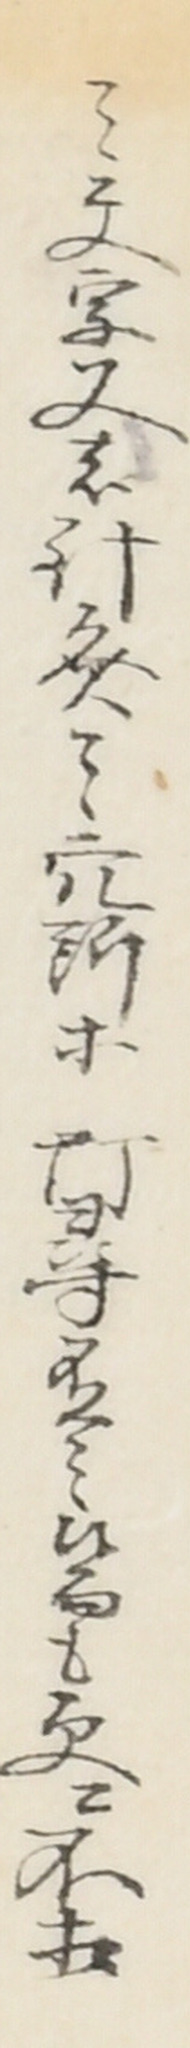之文字又者針灸之穴所等御尋有之候而も更ニ不相
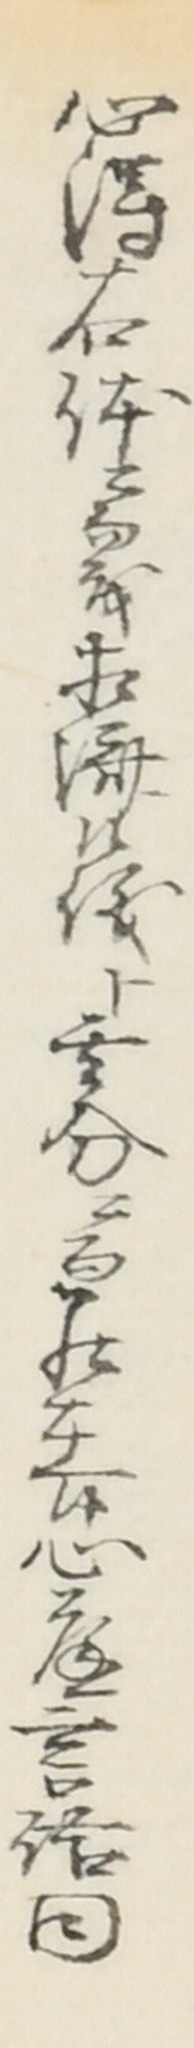心得右体ニ而茂相済候儀ト其分ニ而罷在候心底言語同
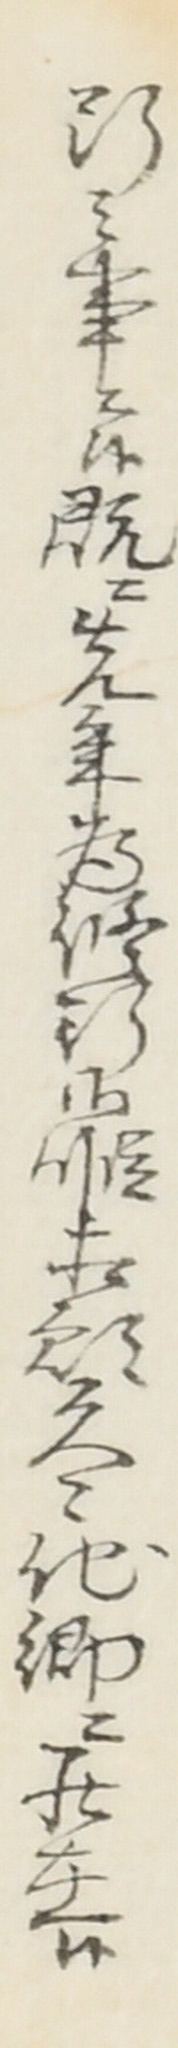断之事ニ候既ニ先年為修行御暇相願久々他郷ニ罷在候
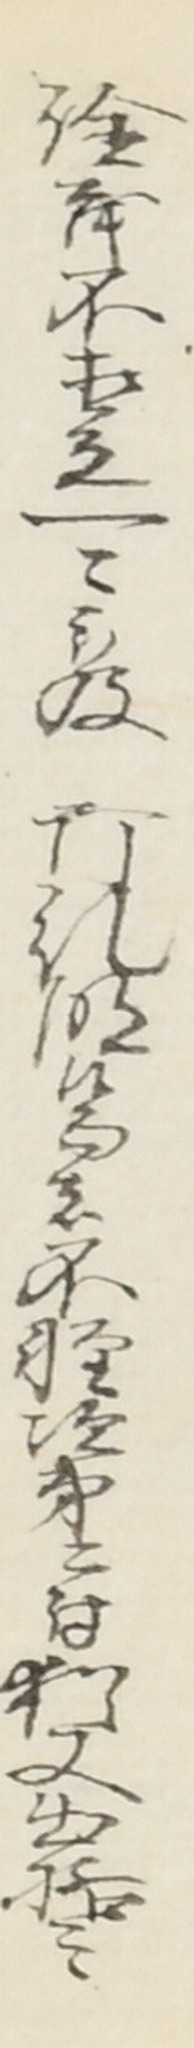詮茂不相立一々被及御糺明候而者不軽次第ニ付猶又出格之
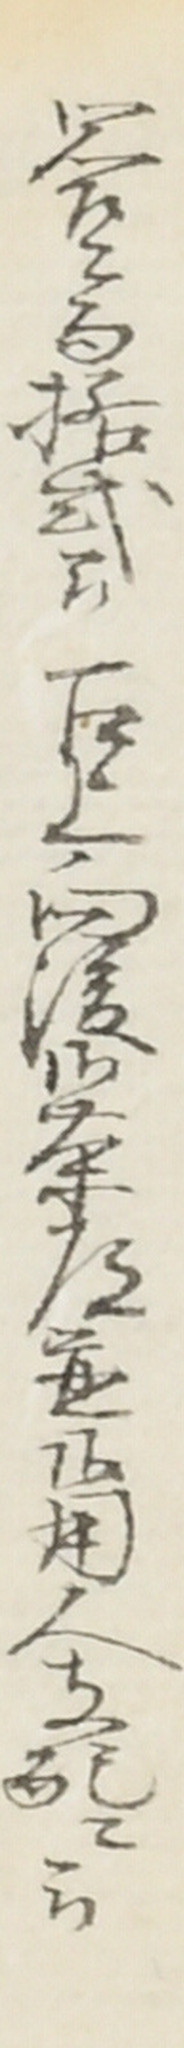思召ニ而格式被召上向後御茶道並御用人支配ニ被
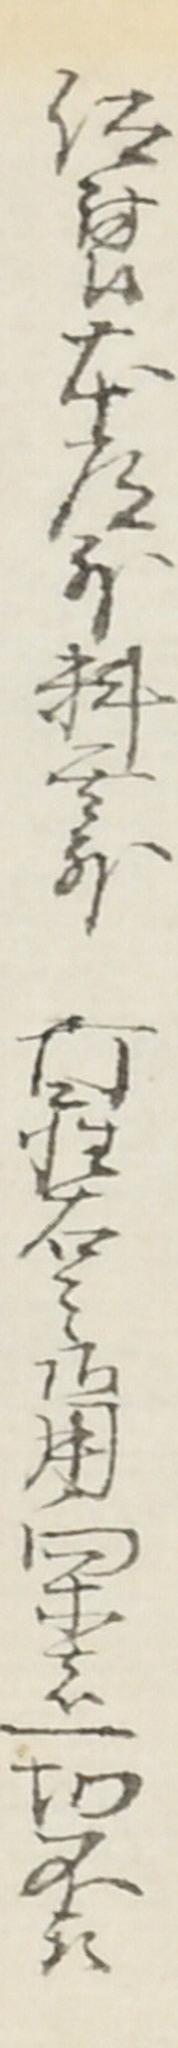仰付候本道外科其外御座右之御用向等者一切不被
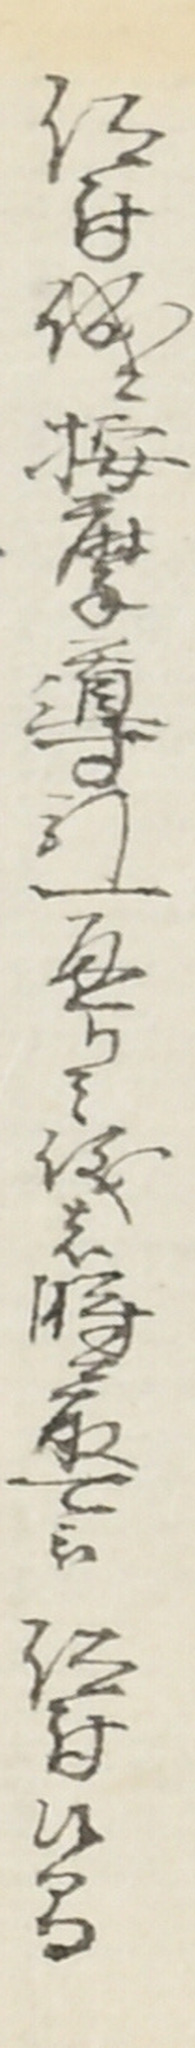仰付誠ニ按摩導引一通リ之儀者時ニ取可被仰付候間
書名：給人諸士勤仕録（七）
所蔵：伊那市立高遠町図書館・合同会社AMANE
